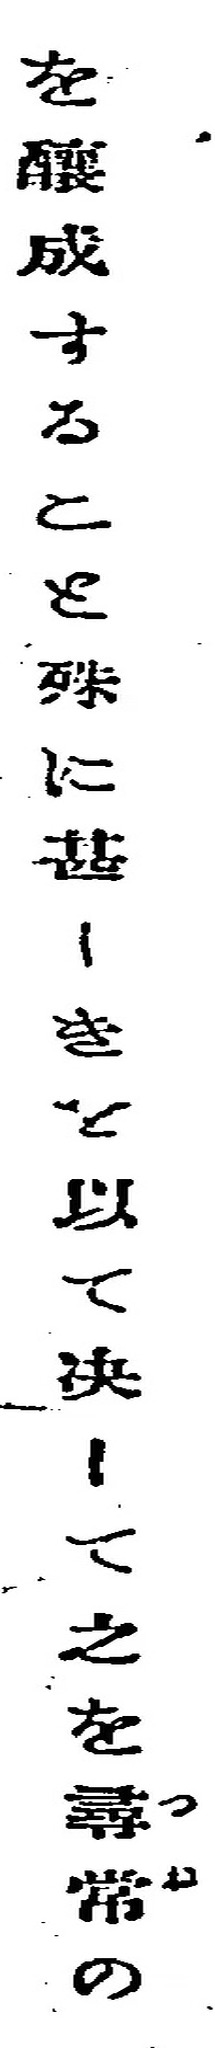を醸成すること殊に甚しきを以て決して之を尋常の
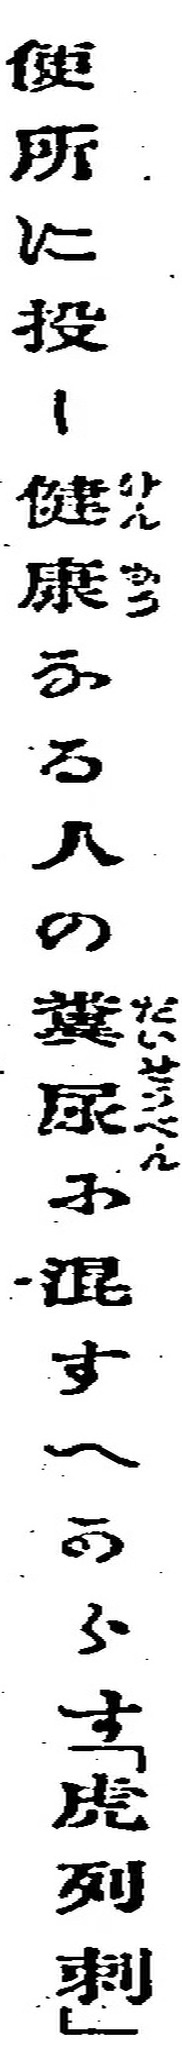便所に投し健康なる人の糞尿に混すへからす「虎列刺」

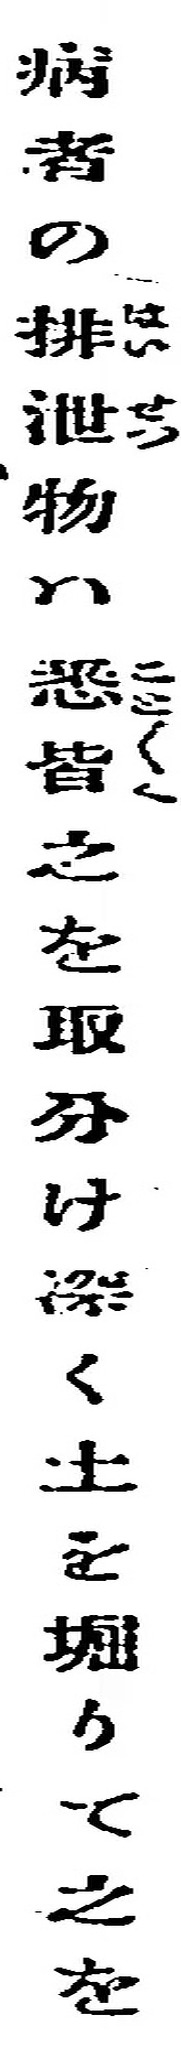病者の排泄物は悉皆之を取分け深く土を堀りて之を
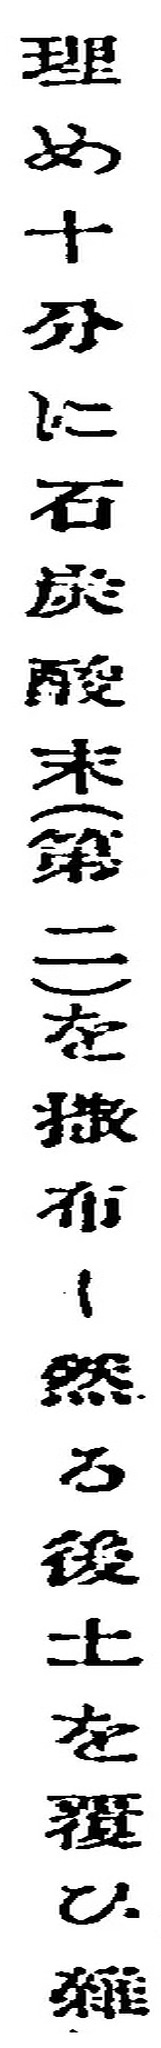埋め十分に石炭酸末(第二)を撒布し然る後土を覆ひ雑
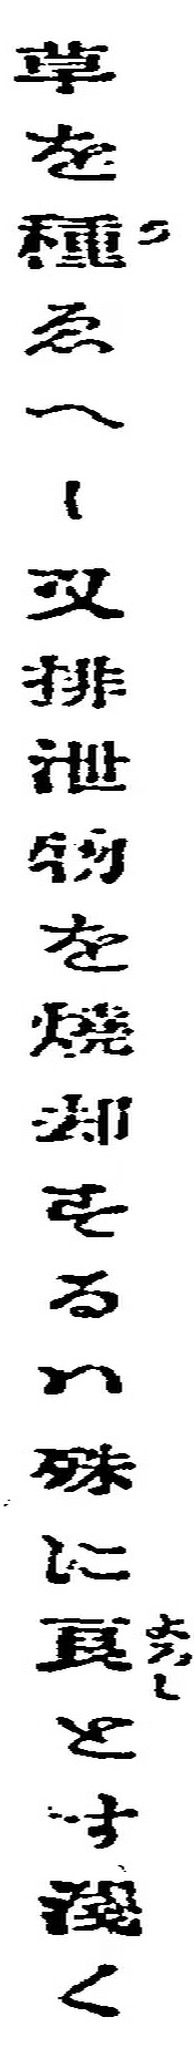草を種ゑへし又排泄物を焼却するは殊に良とす浅く
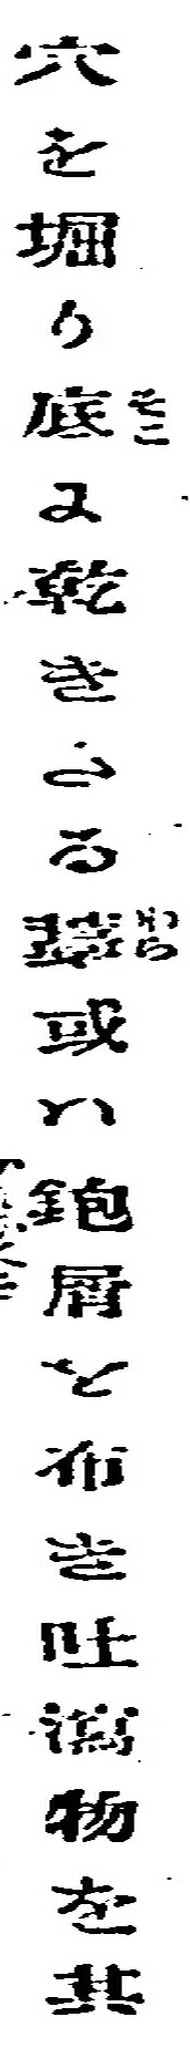穴を堀り底に乾きたる藁或は鉋屑を布き吐瀉物を其
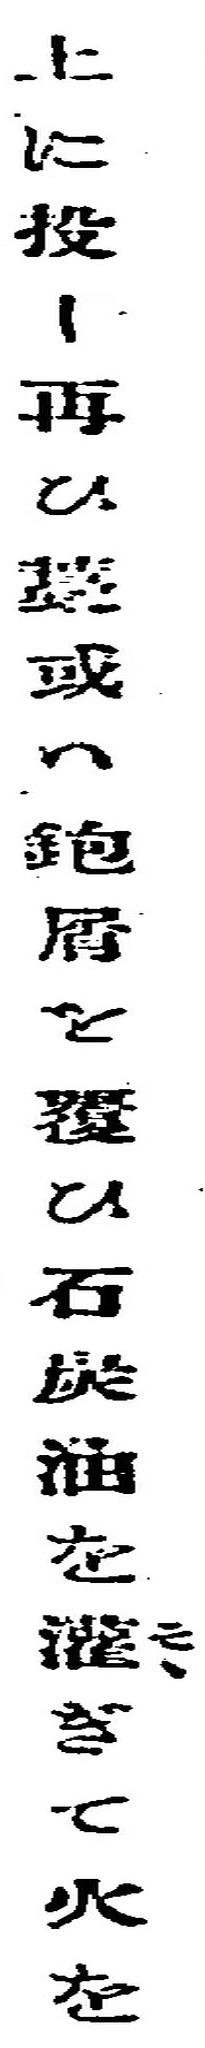上に投し再ひ藁或は鉋屑を覆ひ石炭油を灌ぎて火を
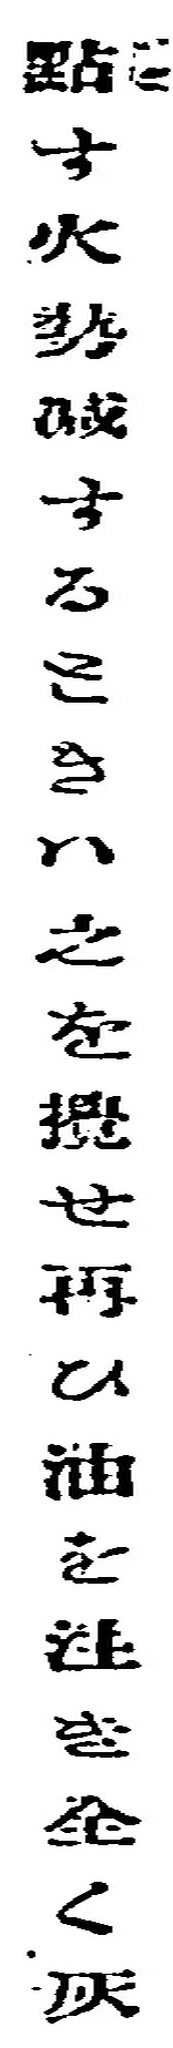点す火勢減するときは之を攪せ再ひ油を注き全く灰
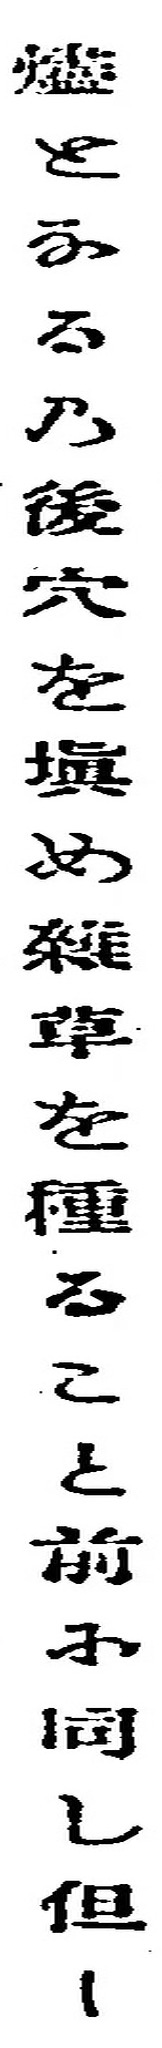燼となるの後穴を塡め雑草を種ること前に同し但し
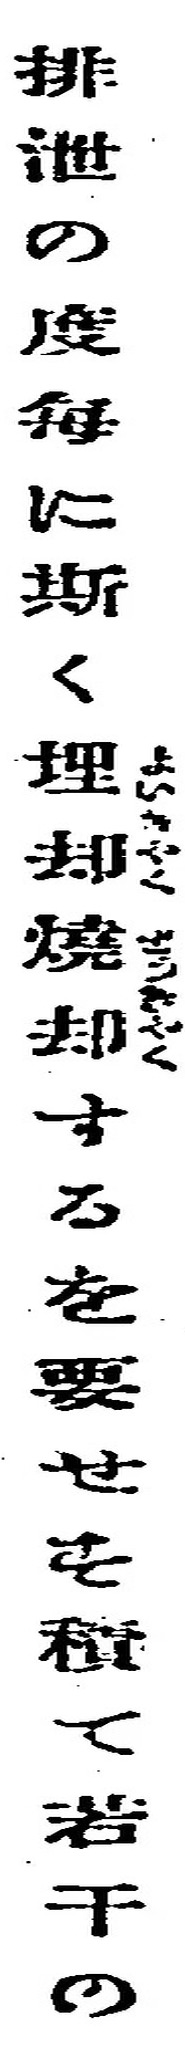排泄の度毎に斯く埋却焼却するを要せす積て若干の
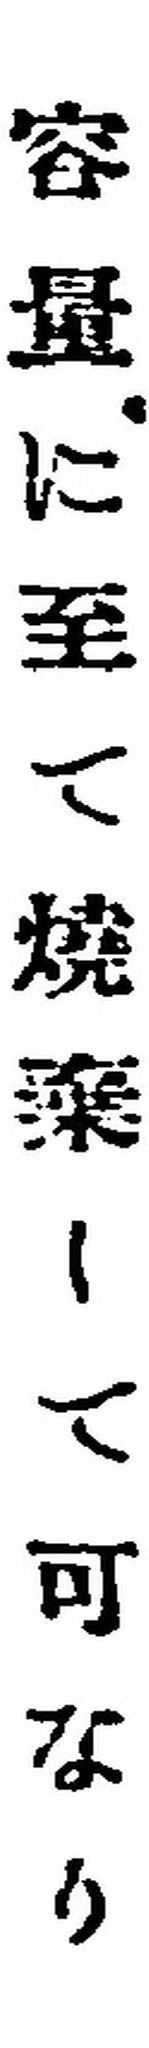容量に至て焼棄して可なり
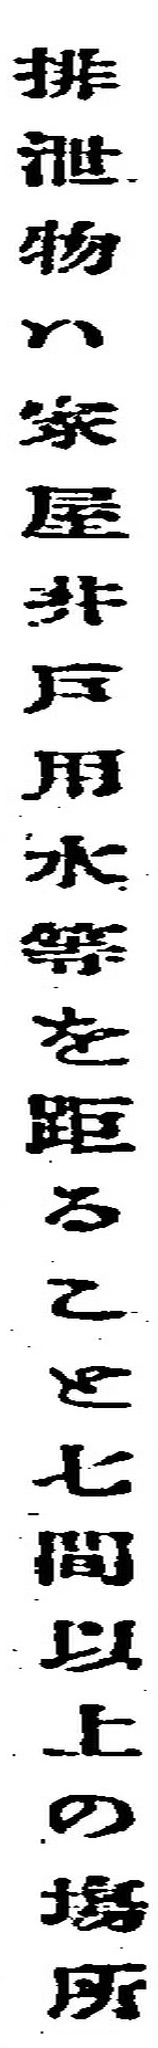排泄物は家屋井戸用水等を距ること七間以上の場所
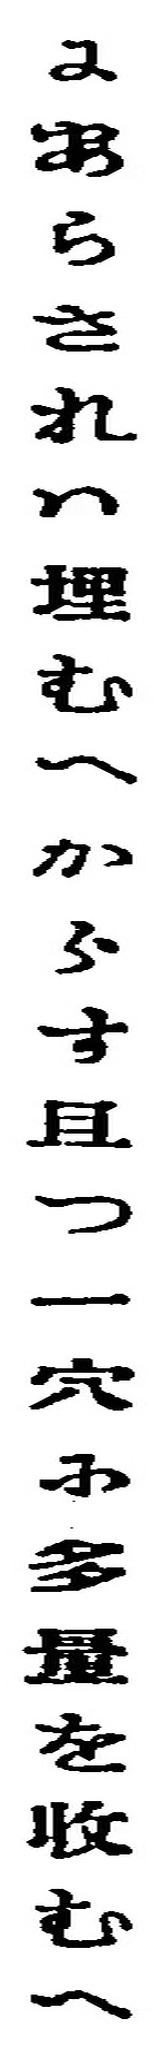にあらされは埋むへからす且つ一穴に多量を収むへ
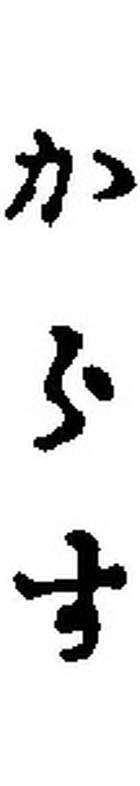からす
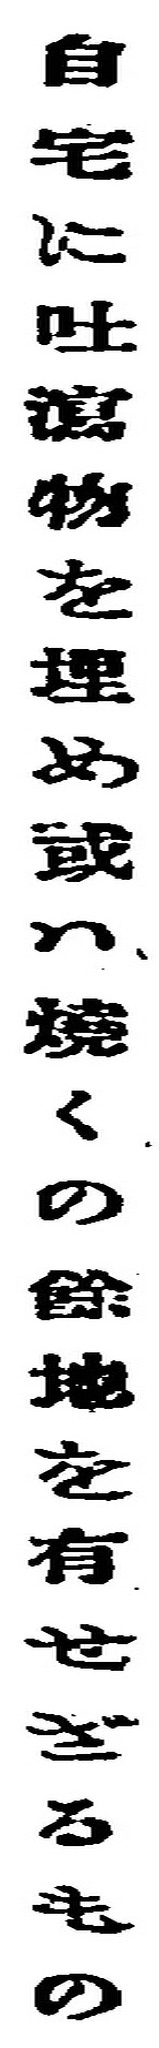自宅に吐瀉物を埋め或は焼くの余地を有せざるもの
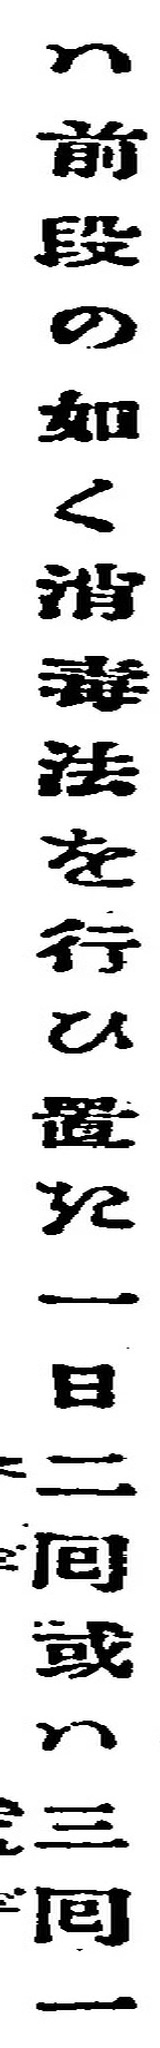は前段の如く消毒法を行ひ置き一日二回或は三回一
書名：これら病予防心得
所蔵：国立国会図書館 National Diet Library, JAPAN
